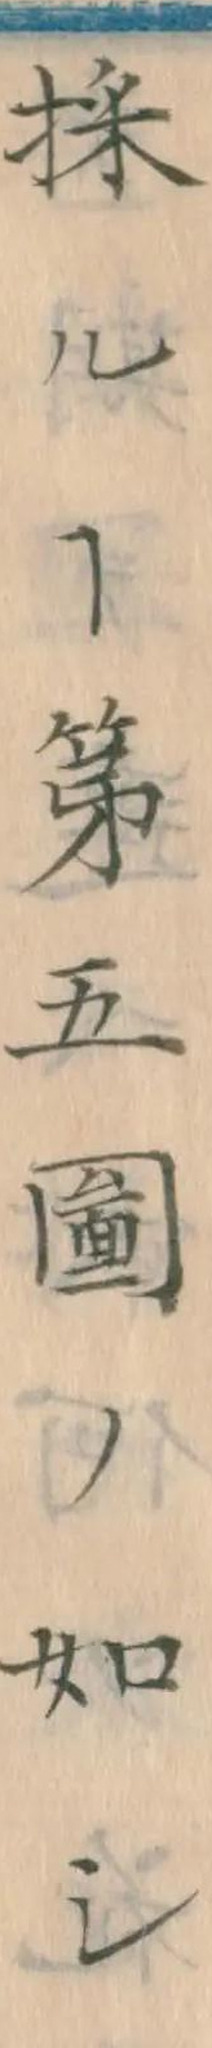採ルコト第五図ノ如シ
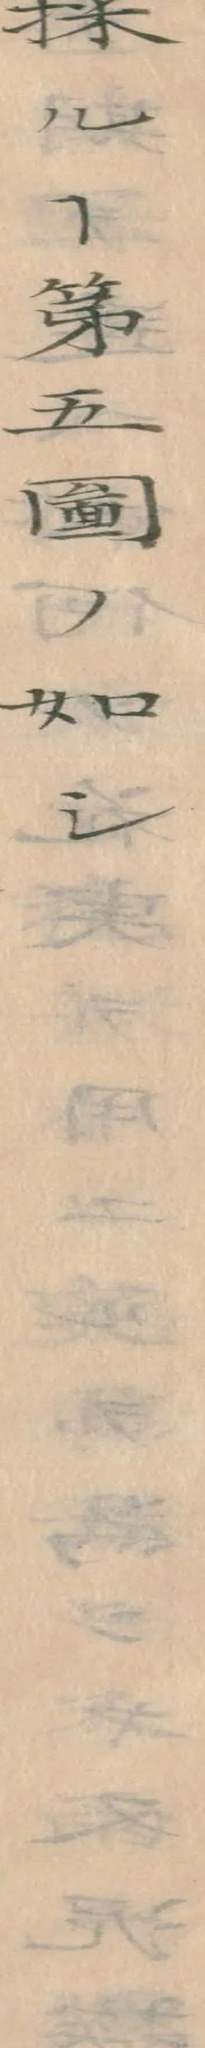採ルコト第五図ノ如シ
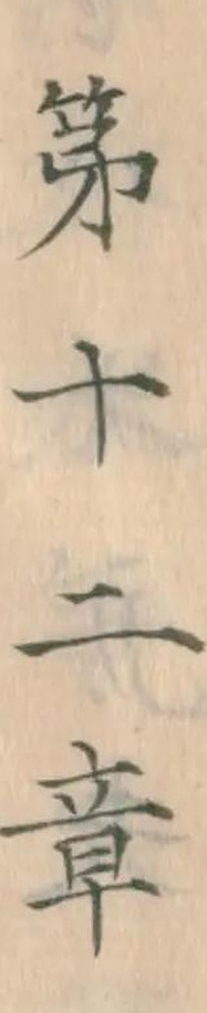第十二章
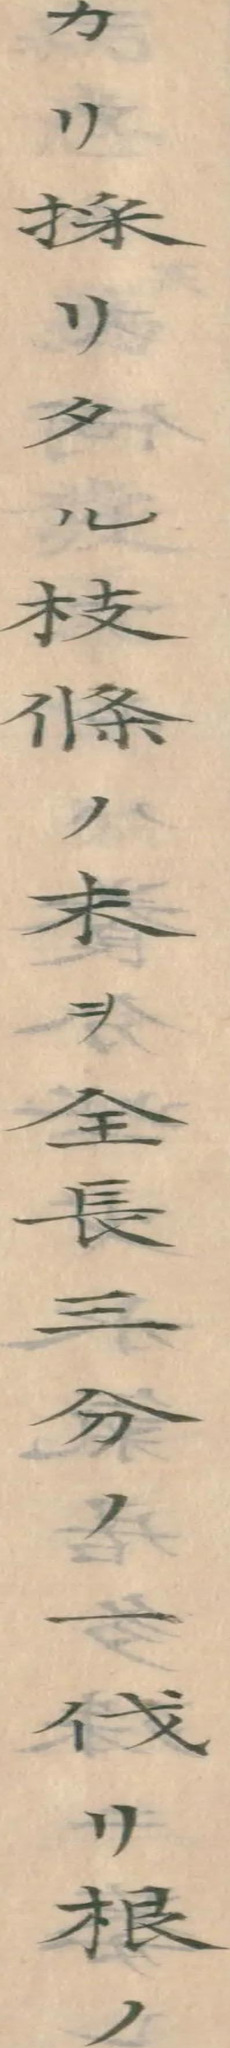カリ採リタル枝条ノ末ヲ全長三分ノ一伐リ根ノ
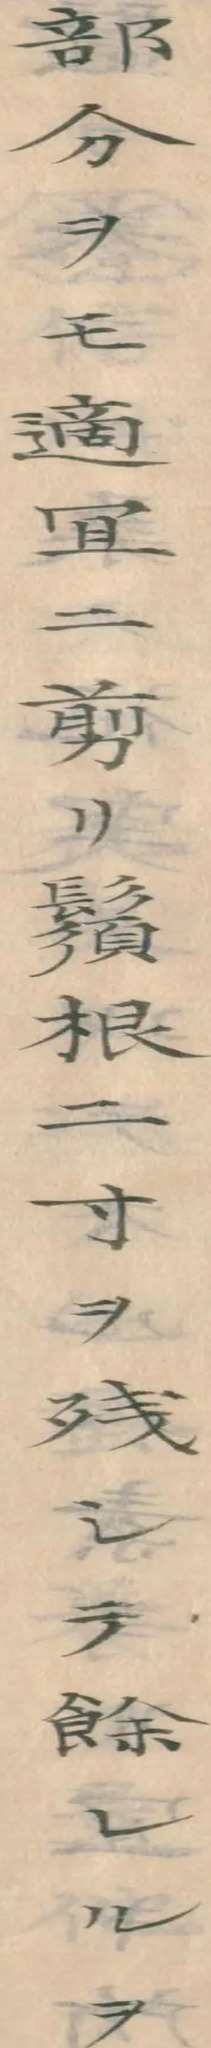部分ヲモ適宜ニ剪リ鬚根二寸ヲ残シテ余レルヲ
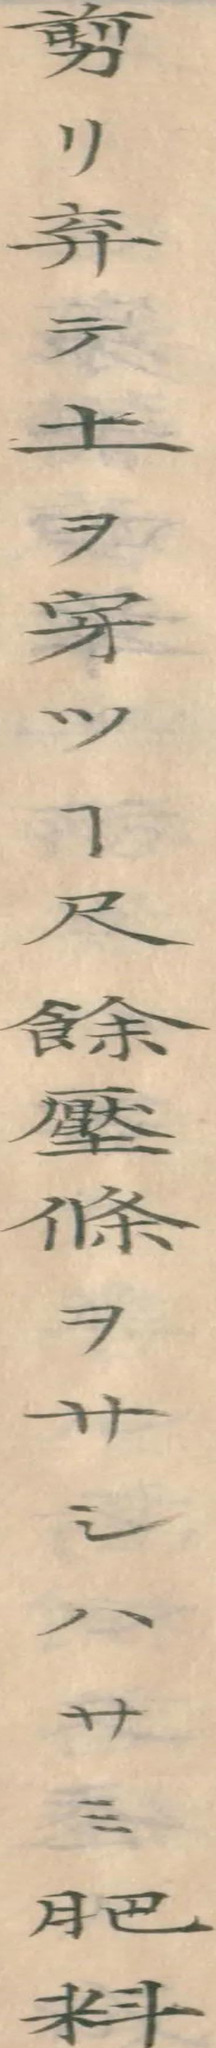剪リ棄テ土ヲ穿ツコト尺余圧条ヲサシハサミ肥料
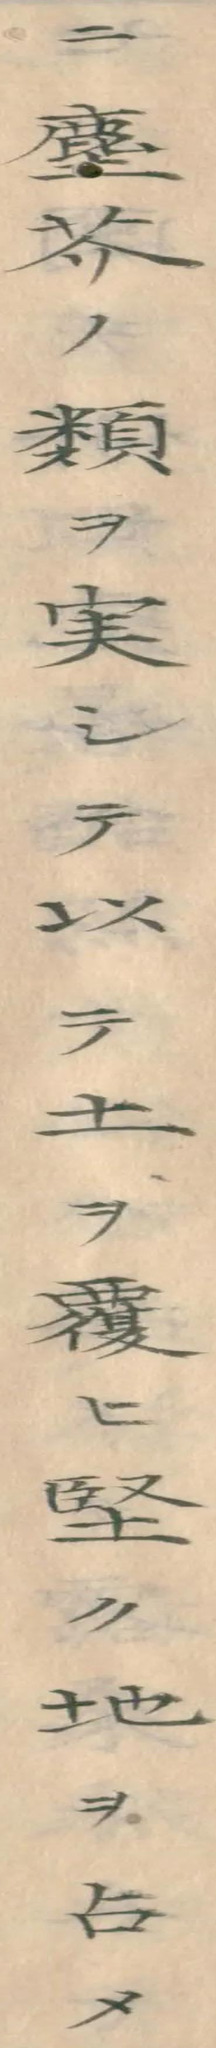ニ塵芥ノ類ヲ実シテ以テ土ヲ覆ヒ堅ク地ヲ占メ
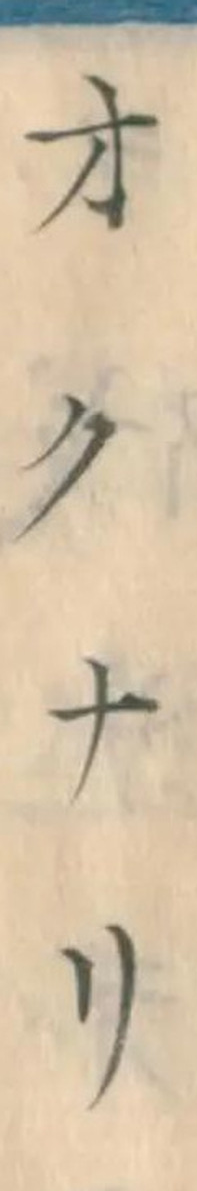オクナリ
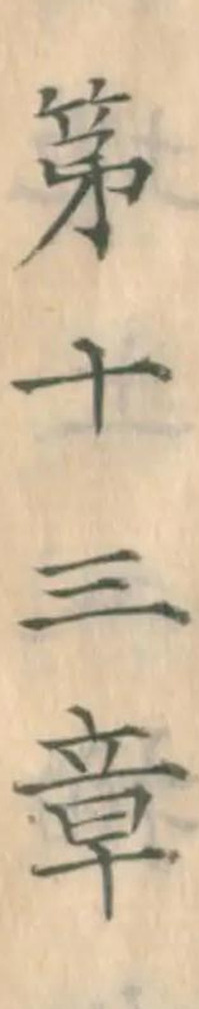第十三章

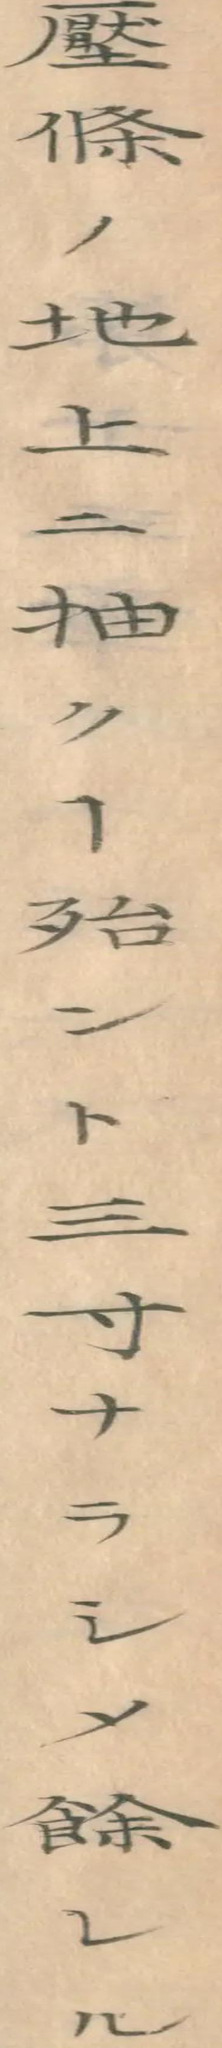圧条ノ地上ニ抽クコト殆ント三寸ナラシメ余レル
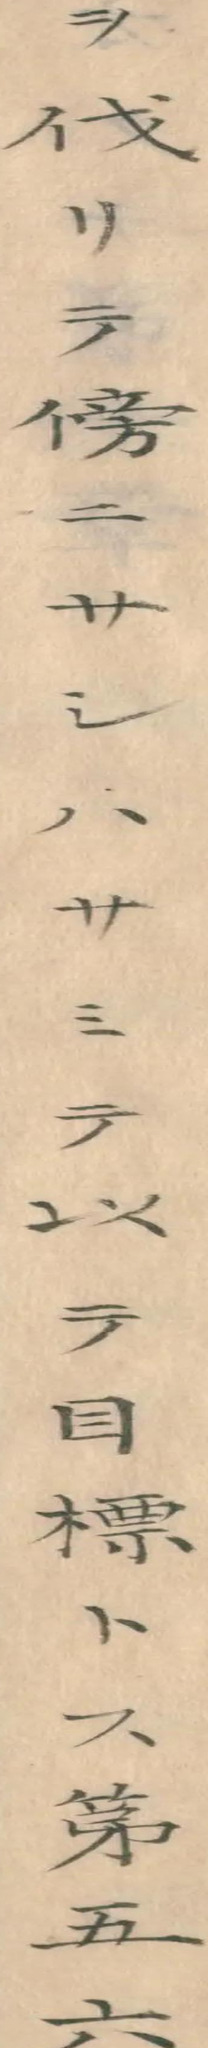ヲ伐リテ傍ニサシハサミテ以テ目標トス第五六
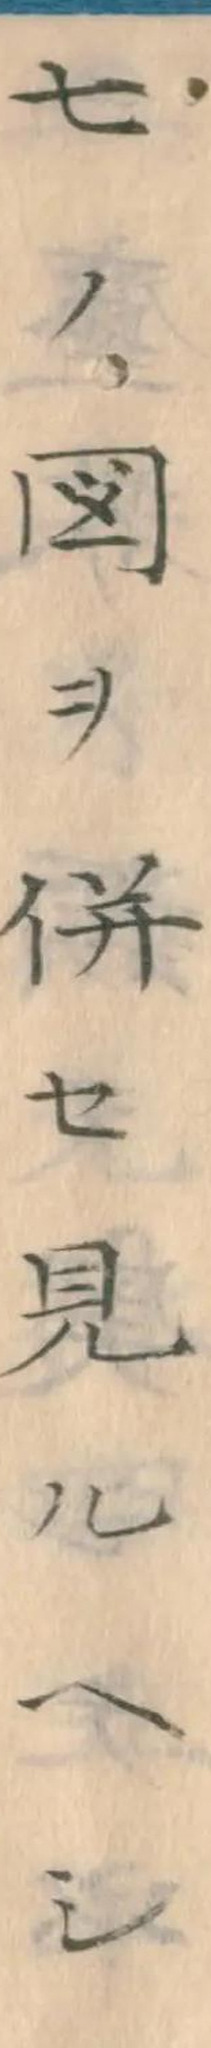七ノ図ヲ併セ見ルヘシ
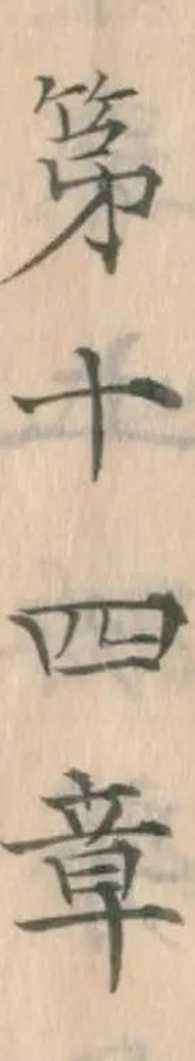第十四章
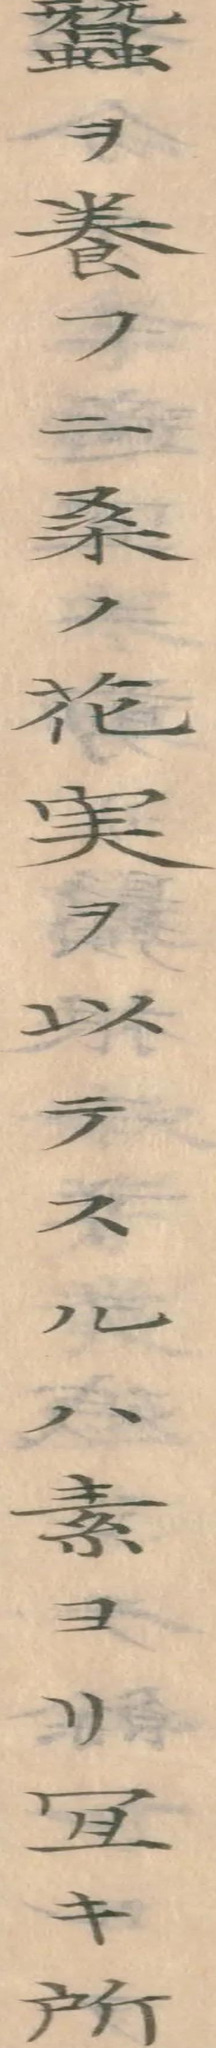蚕ヲ養フニ桑ノ花実ヲ以テスルハ素ヨリ宜キ所
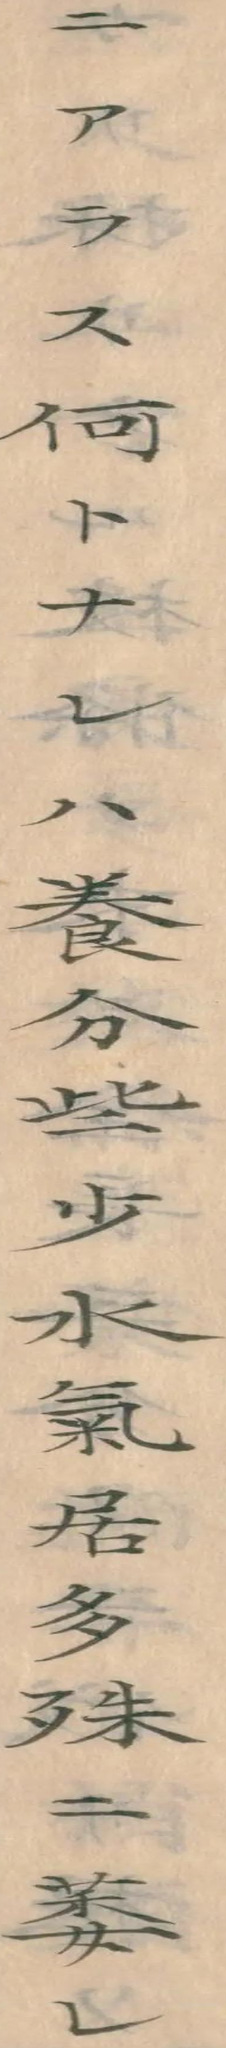ニアラス何トナレハ養分些少水気居多殊ニ萎レ
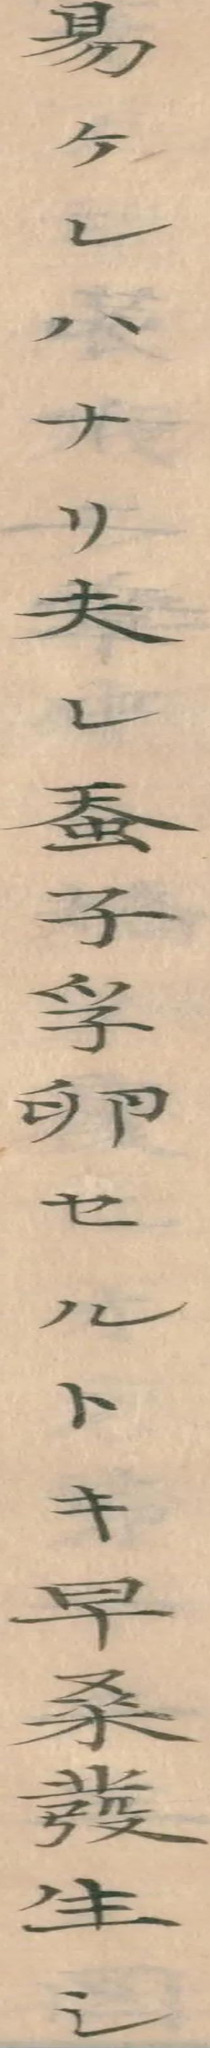易ケレハナリ夫レ蚕子孚卵セルトキ早桑発生シ
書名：蚕桑集成
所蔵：国立国会図書館 National Diet Library, JAPAN
